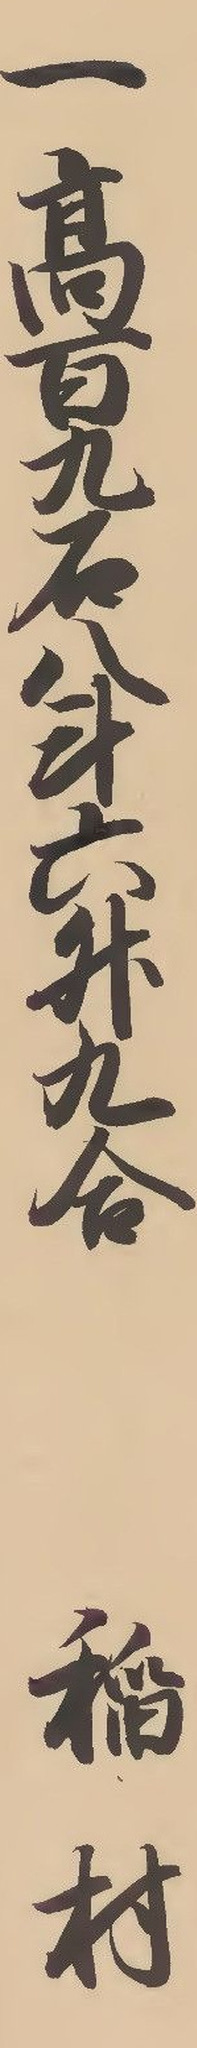一高百九石八斗六升九合稲村
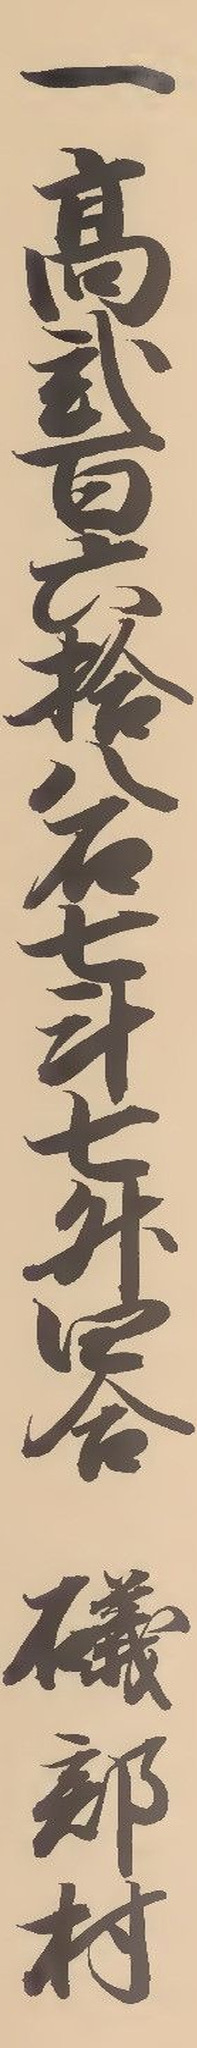一高弐百六拾八石七斗七升四合磯部村
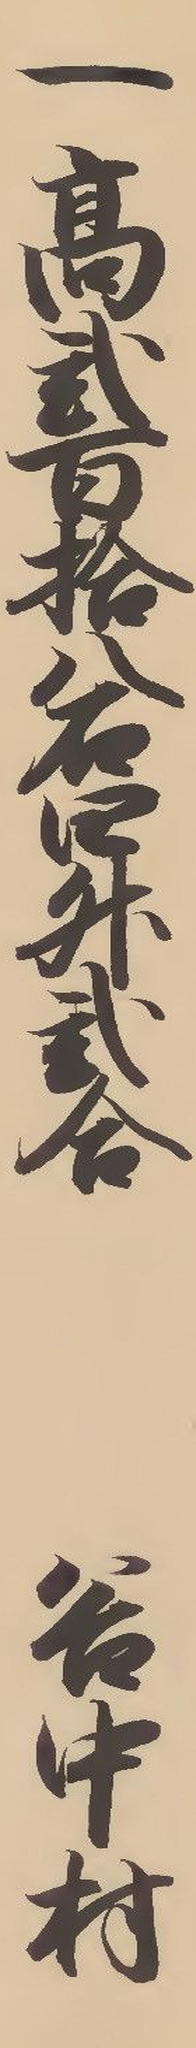一高弐百拾八石四升弐合谷中村
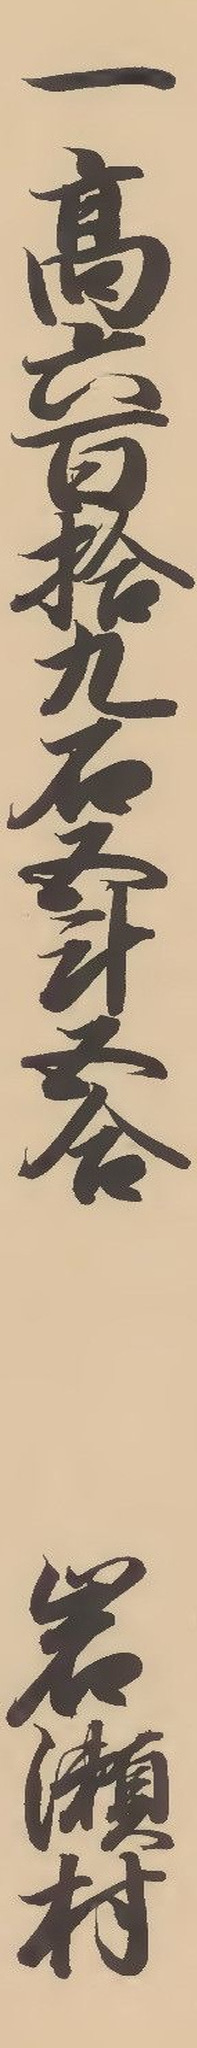一高六百拾九石五斗五合岩瀬村
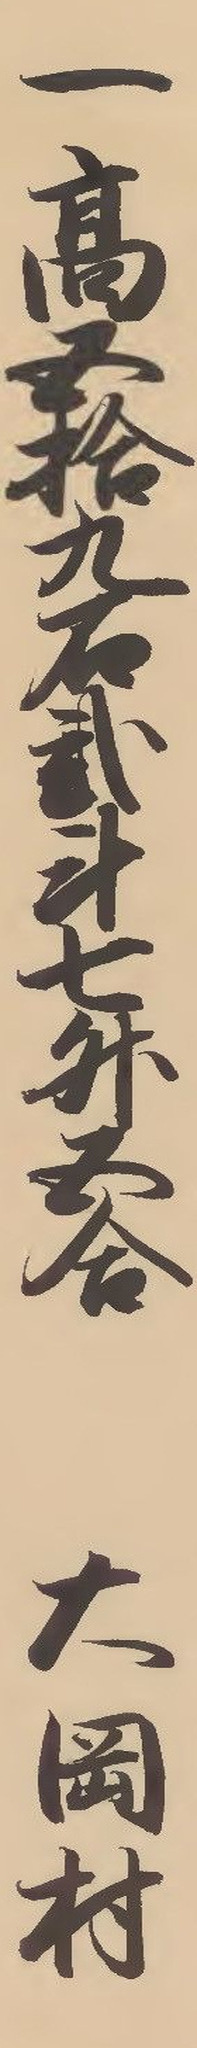一高五拾九石弐斗七升五合大岡村

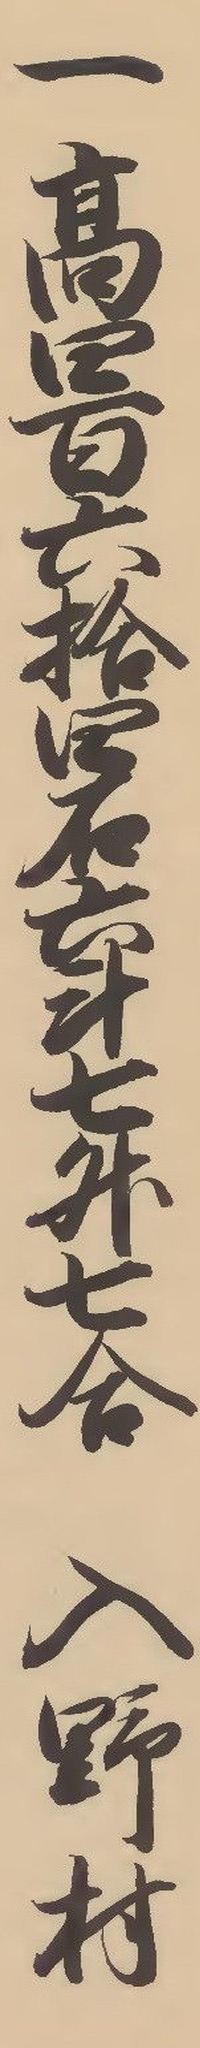一高四百六拾四石六斗七升七合入野村
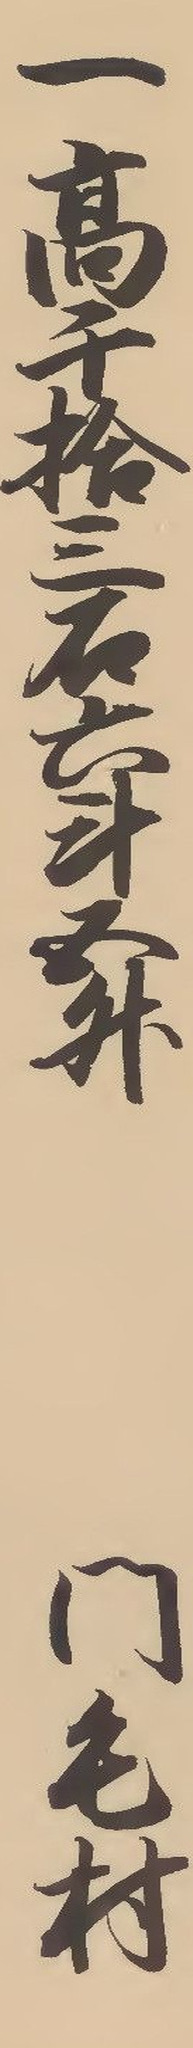一高千拾三石六斗五升門毛村
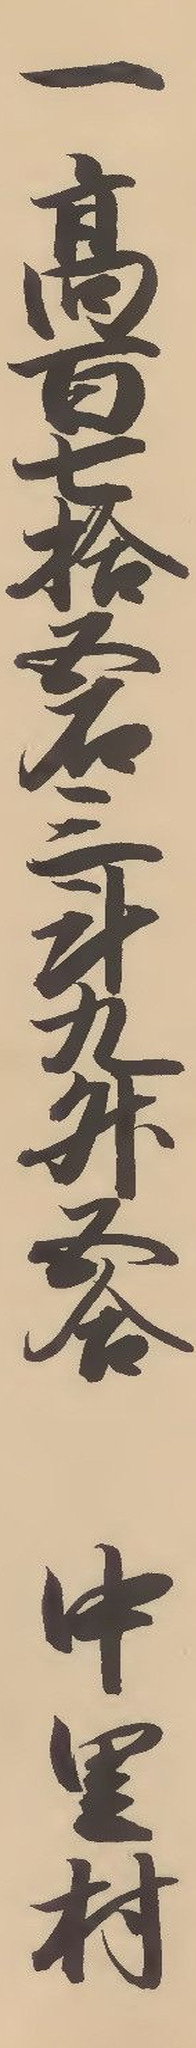一高百七拾五名三斗九升五合中里村
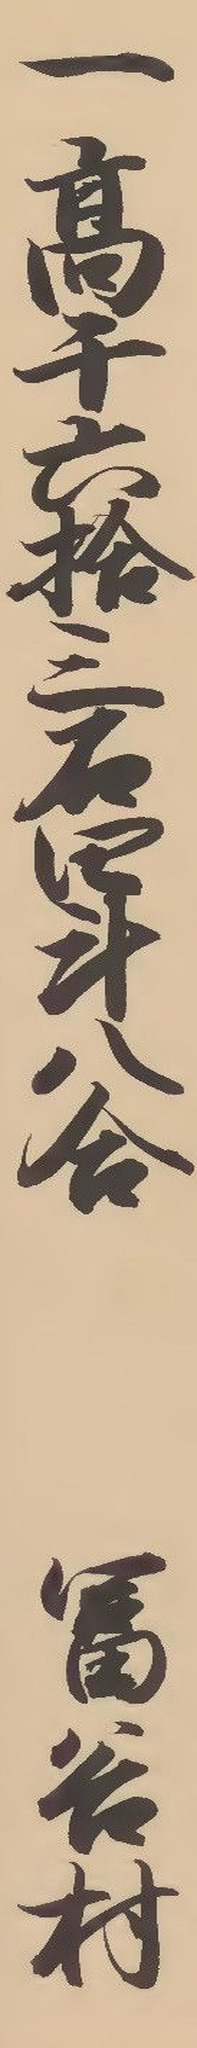一高千六拾三石四斗八合冨谷村
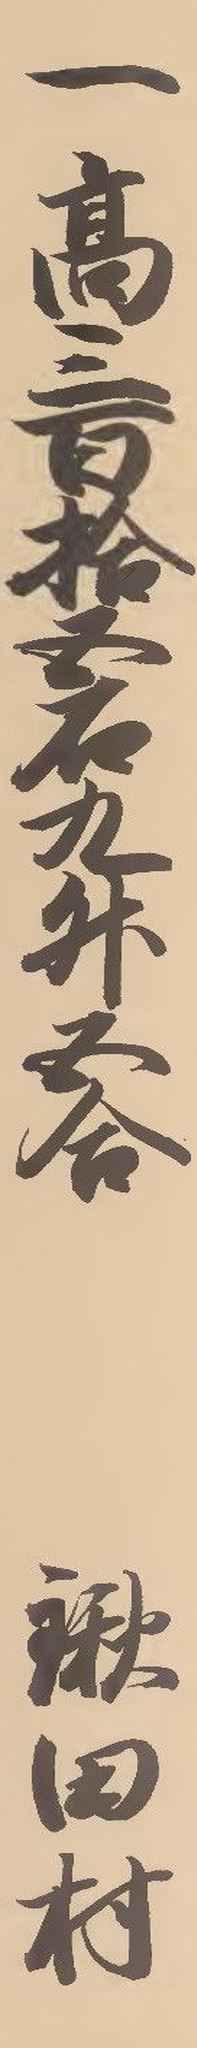一高三百拾五石九升五合鍬田村
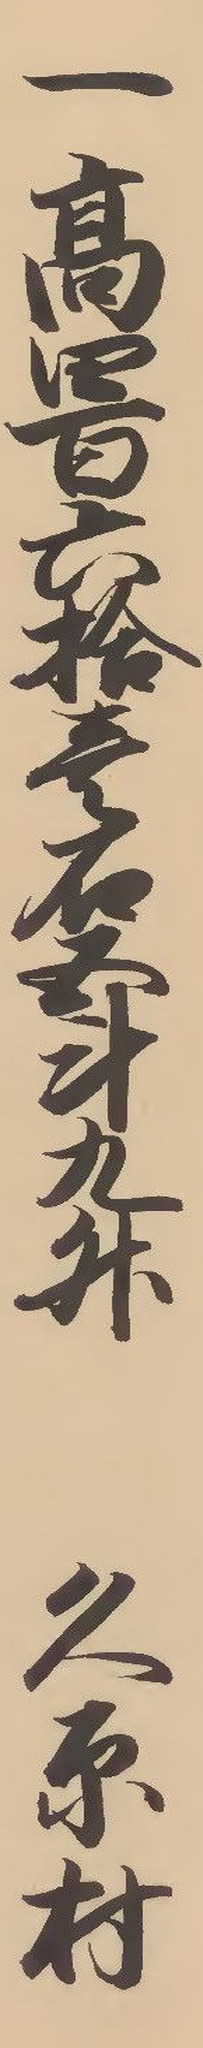一高四百六拾壱石五斗九升久原村
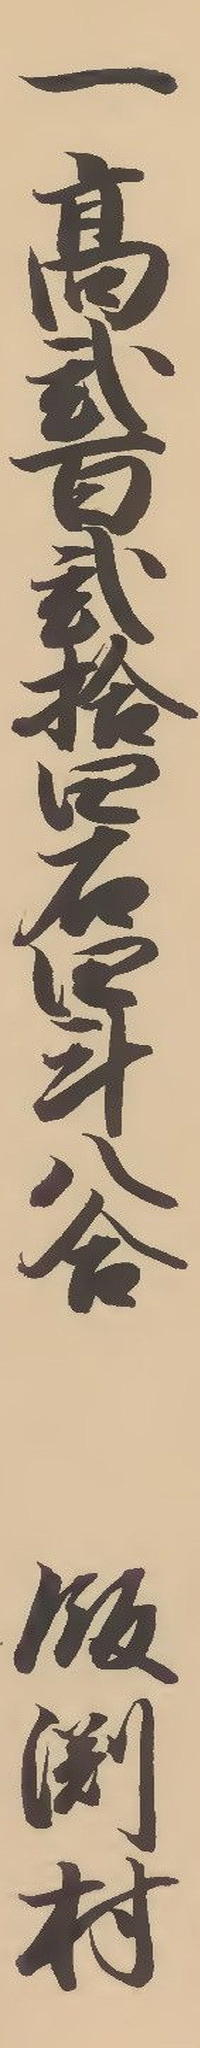一高弐百弐拾四石四斗八合飯淵村
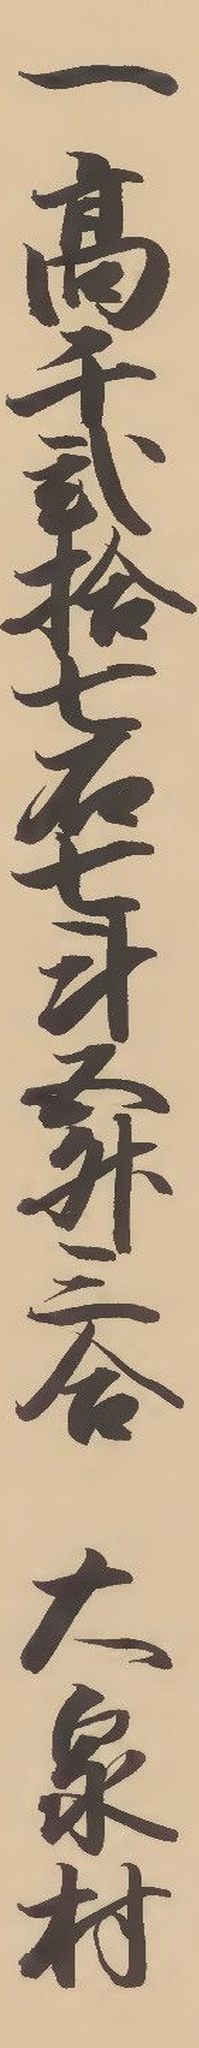一高千弐拾七石七斗五升三合大泉村

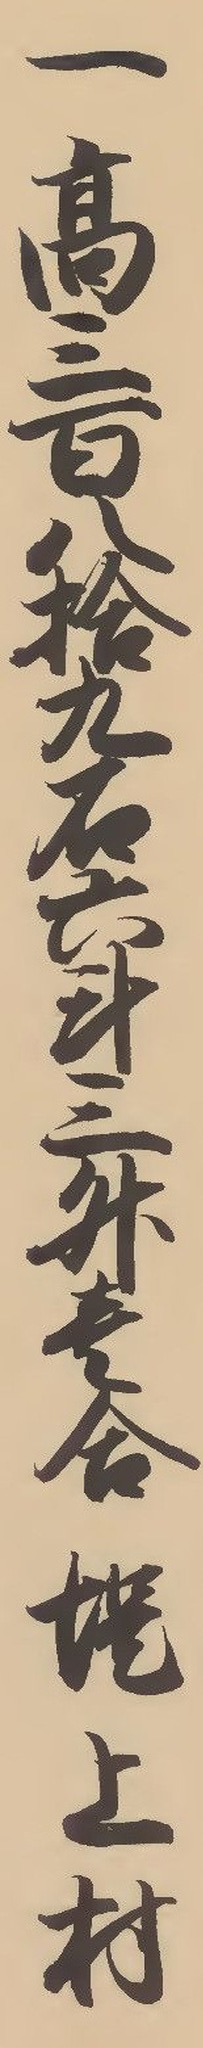一高三百八拾九石六斗三升壱合堤上村
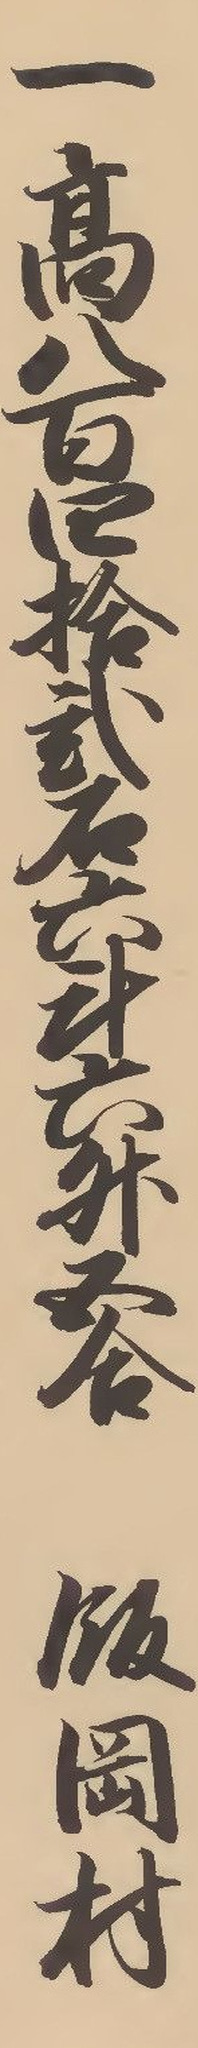一高八百四拾弐石六斗六升五合飯岡村
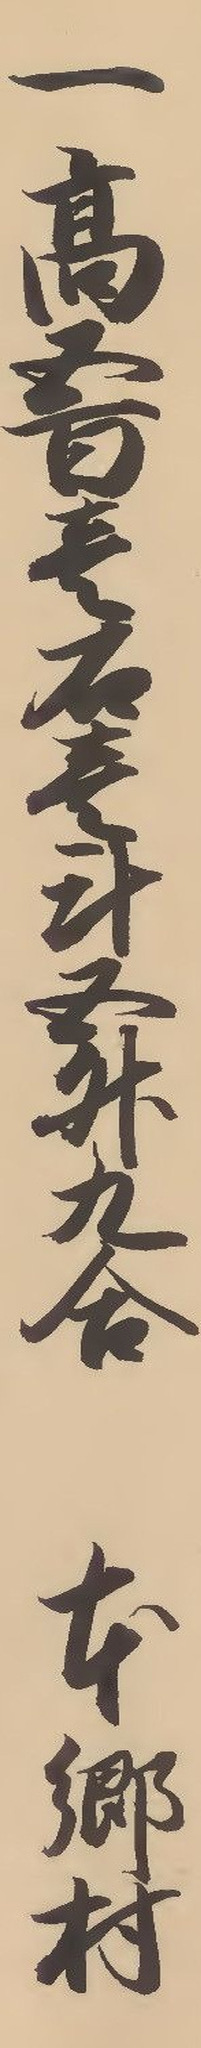一高五百壱石壱斗五升九合本郷村
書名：常陸国郷帳
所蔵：国立公文書館 National Archives of Japan
